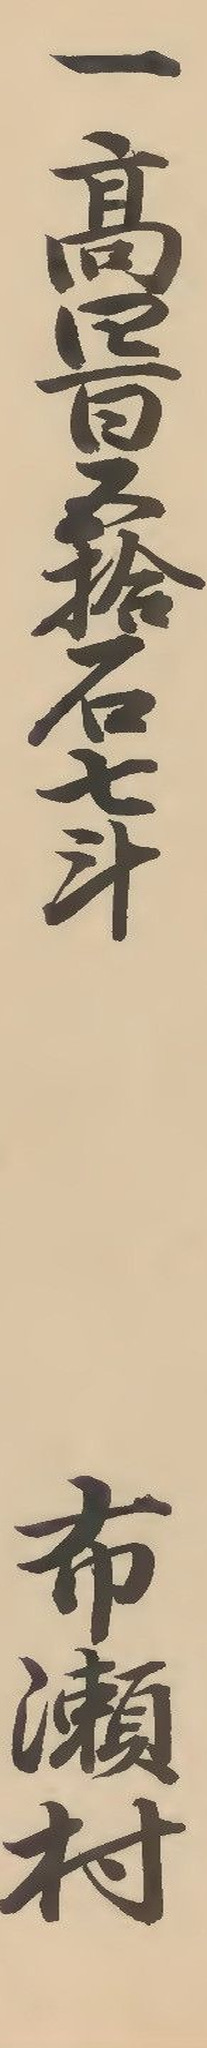一高四百五拾石七斗布瀬村
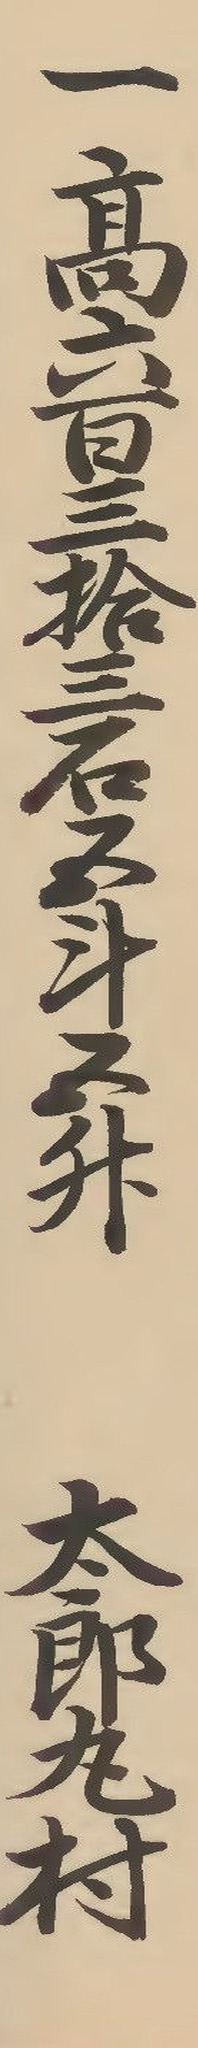一高六百三拾三石五斗五升太郎丸村
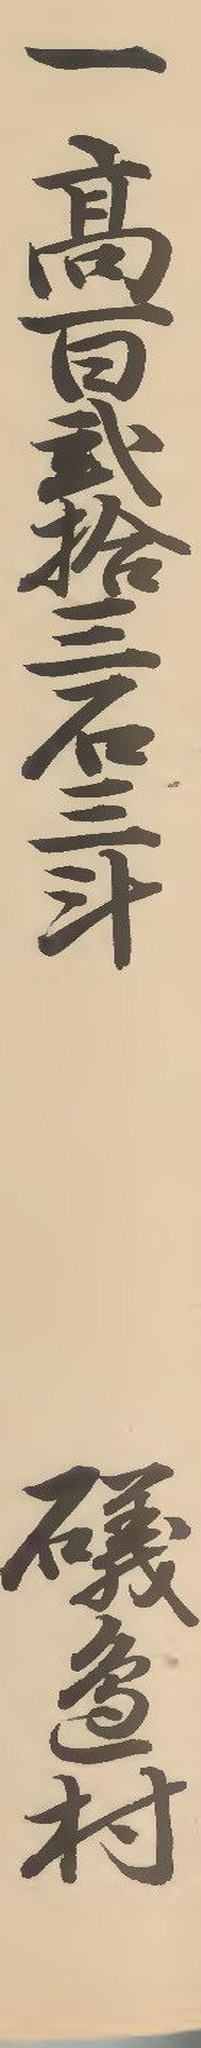一高百弐拾三石三斗礒辺村
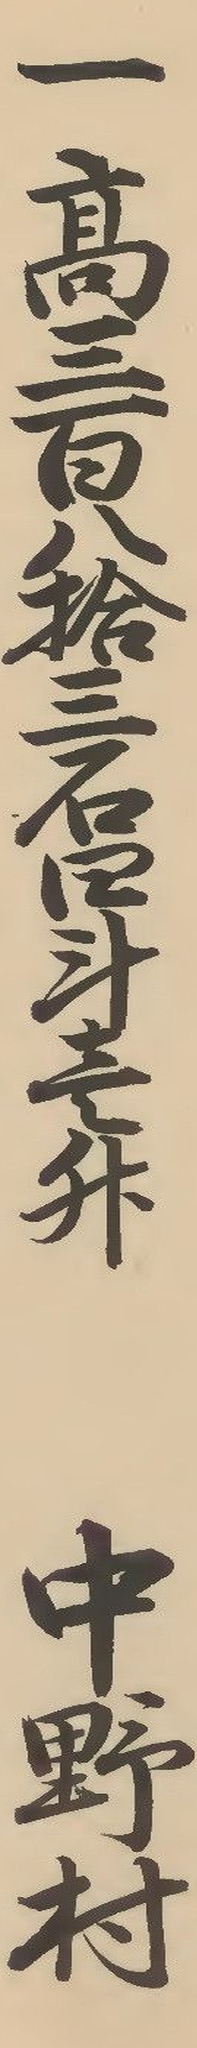一高三百八拾三石四斗壱升中野村
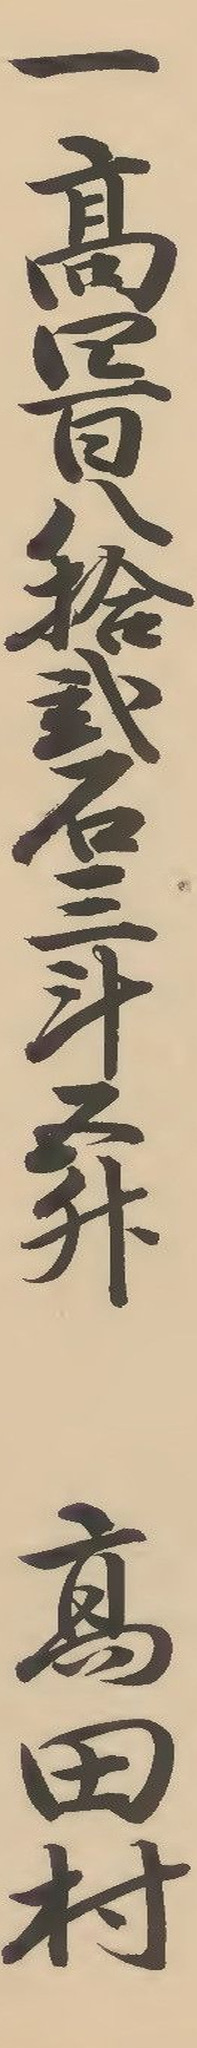一高四百八拾弐石三斗五升高田村

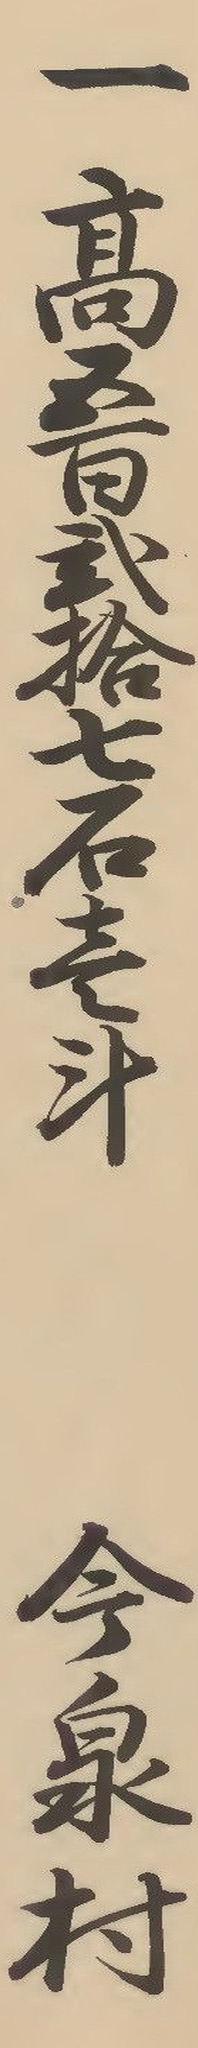一高四百弐拾七石壱斗今泉村
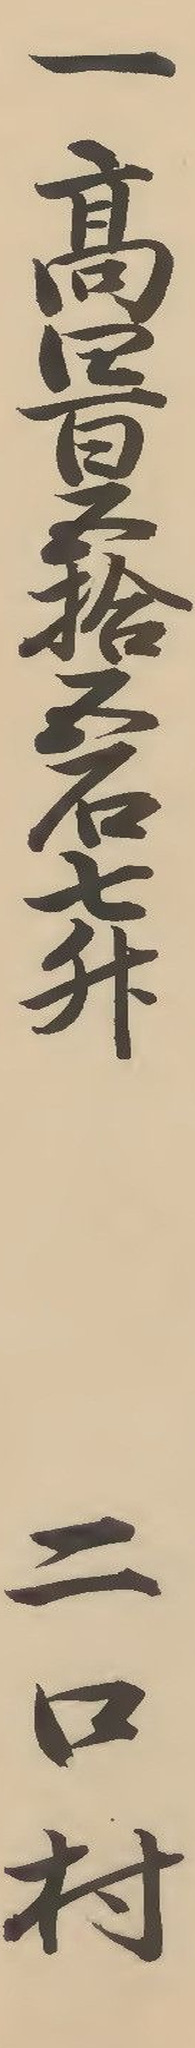一高四百五拾五石七升二口村
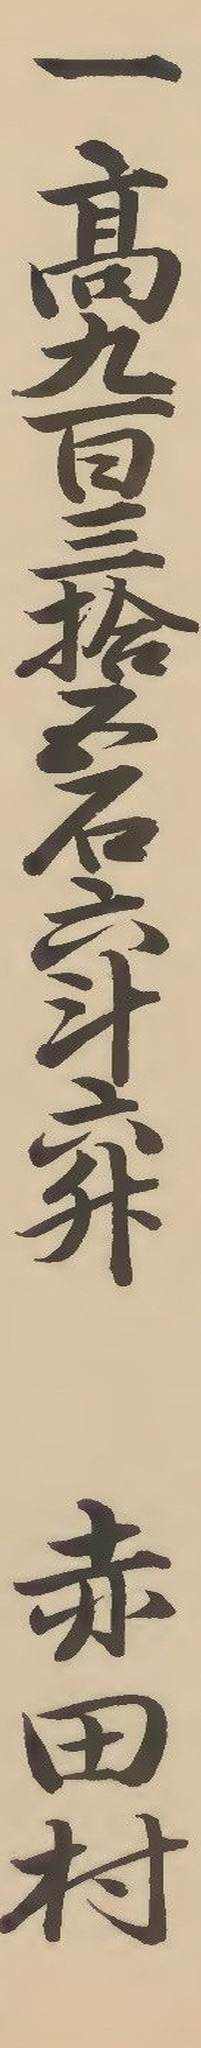一高九百三拾五石六斗六升赤田村
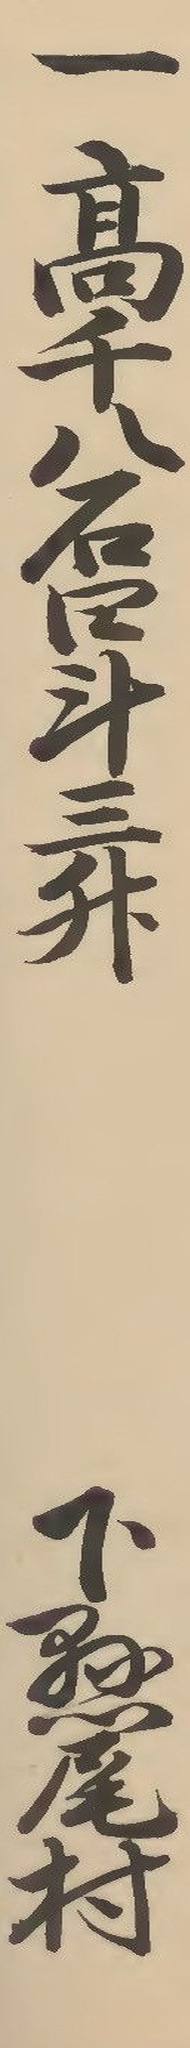一高千八石四斗三升下懸尾村
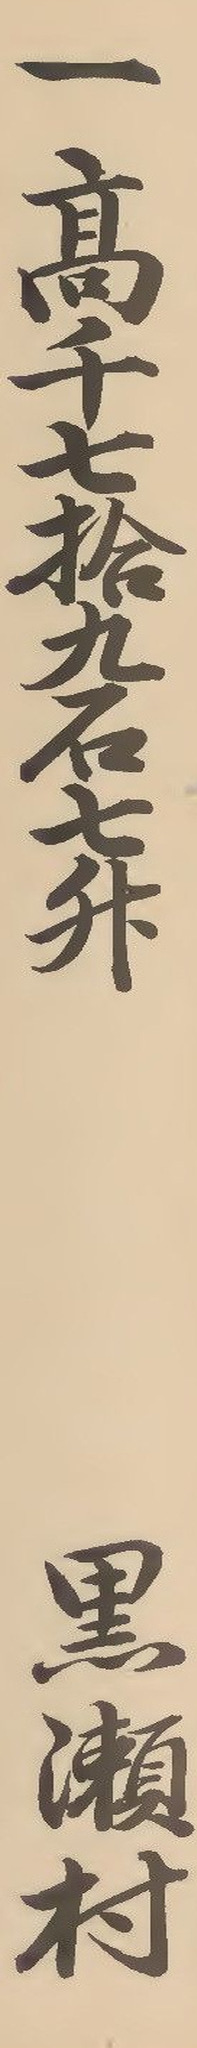一高千七拾九石七升黒瀬村
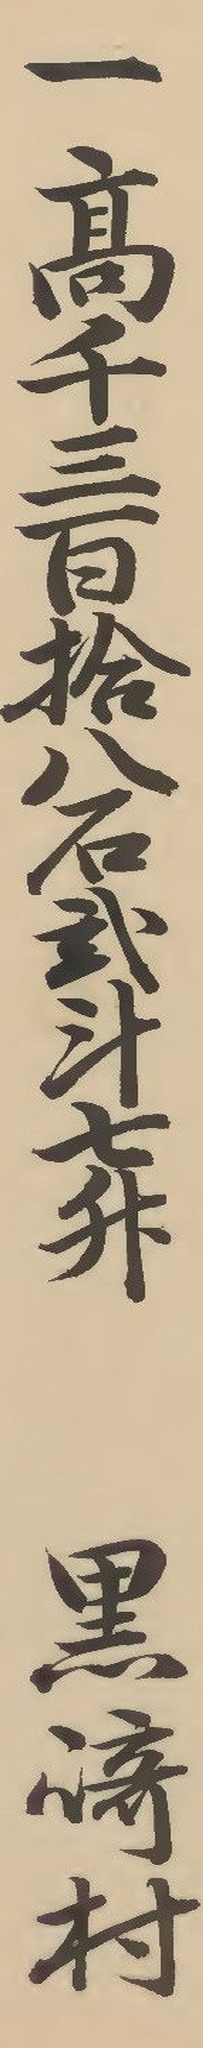一高千三百拾八石弐斗七升黒崎村
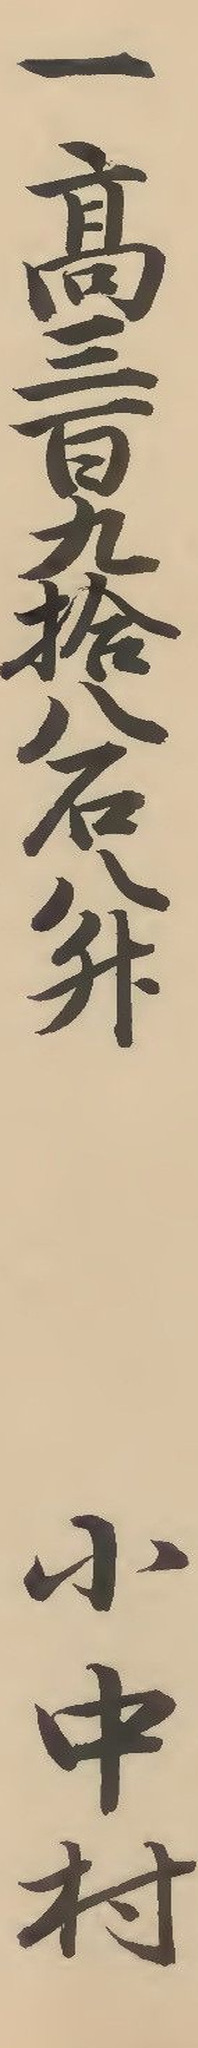一高三百九拾八石八升小中村
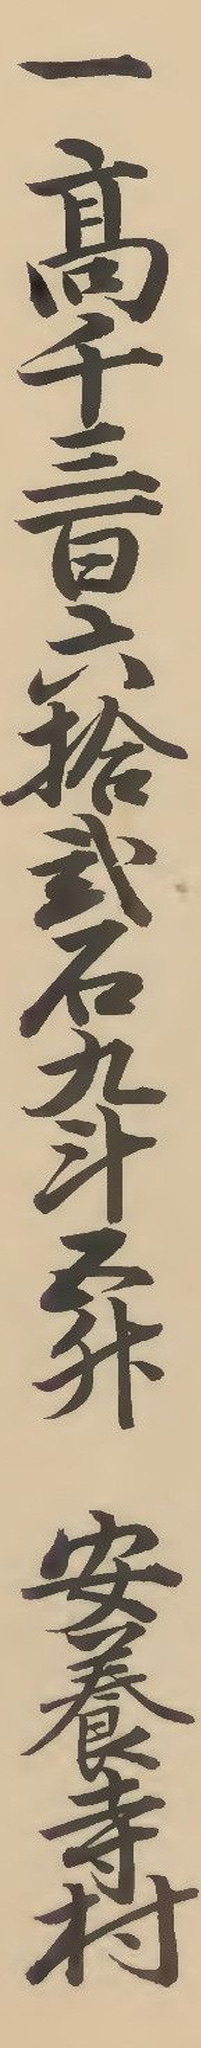一高千三百六拾弐石九斗五升安養寺村

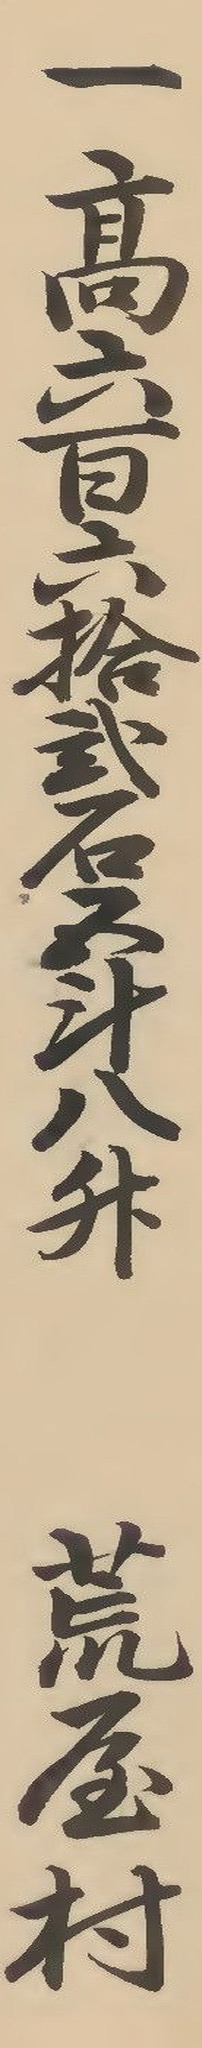一高六百六拾弐石五斗八升荒屋村
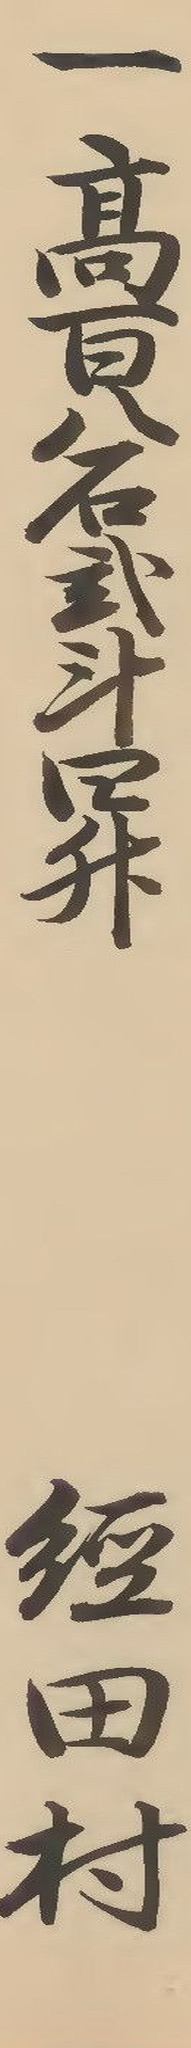一高百八石弐斗四升経田村
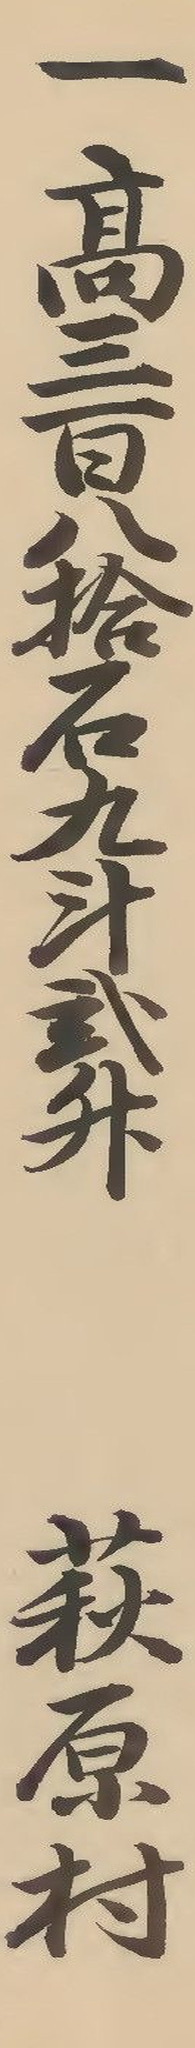一高三百八拾石九斗弐升萩原村
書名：越中国郷帳
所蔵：国立公文書館 National Archives of Japan
